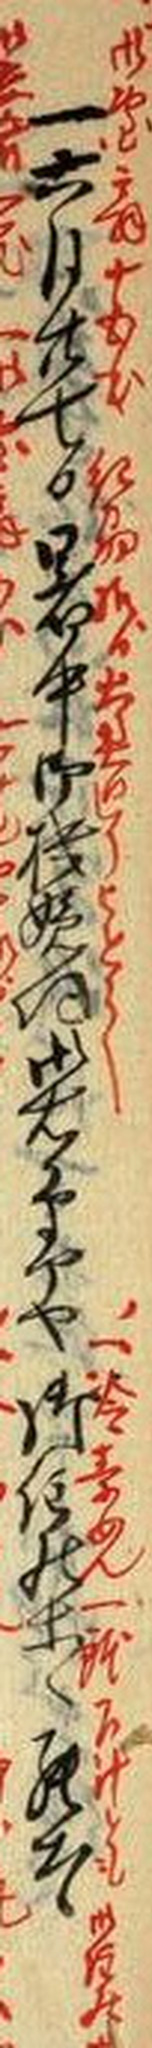一六月廿七日暑中御機嫌伺御右筆部や御住居等へ罷出候
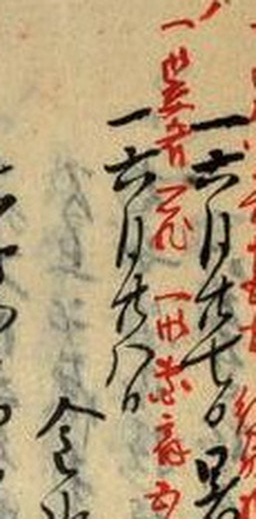一六月廿八日
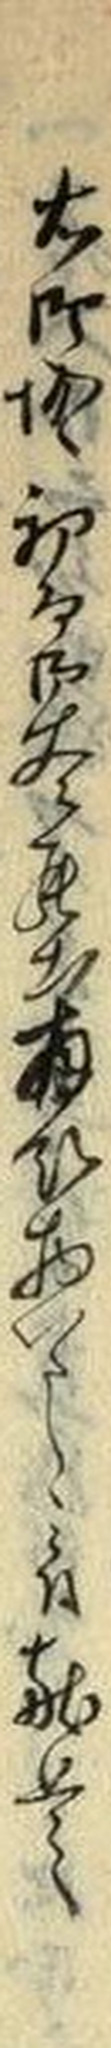右御城へ初而御使ニ罷出拝領物いたし候ニ付献上之
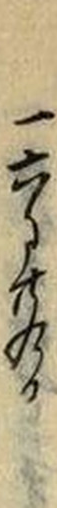一六月廿九日
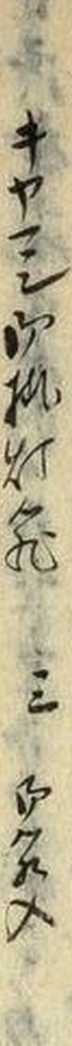キヤマン御掛灯籠三御箱入
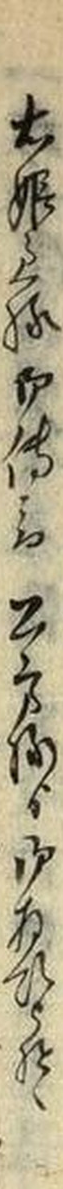右姫君様御伝ニ而公方様ゟ御拝領被遊候
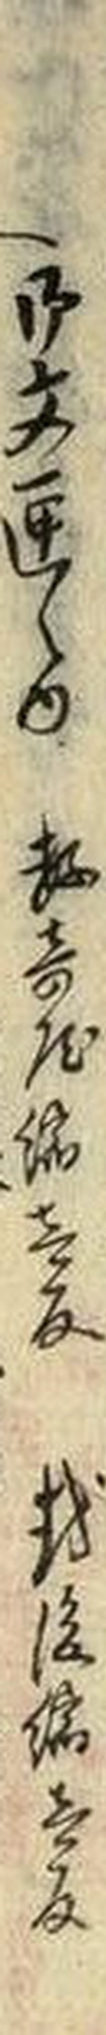御文匣之内数寄屋縮壱反越後縮壱反
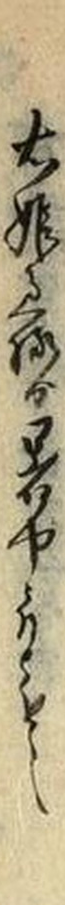右姫君様ゟ暑中ニ付被進之
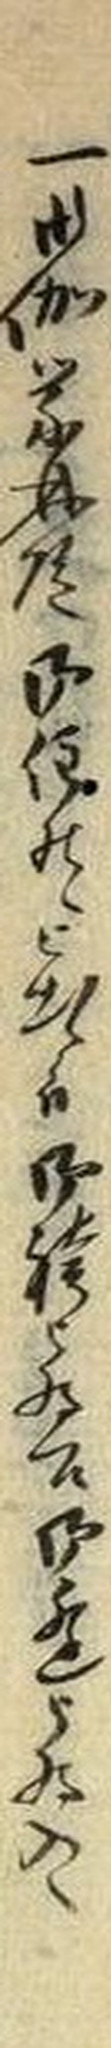一御伽栄林殿御住居へ被出候ニ付御袴被為召御逢被為入候
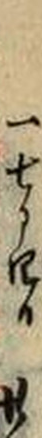一七月四日
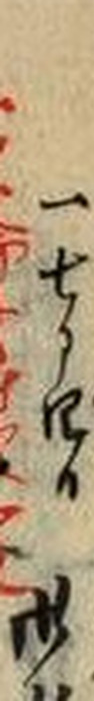一七月四日
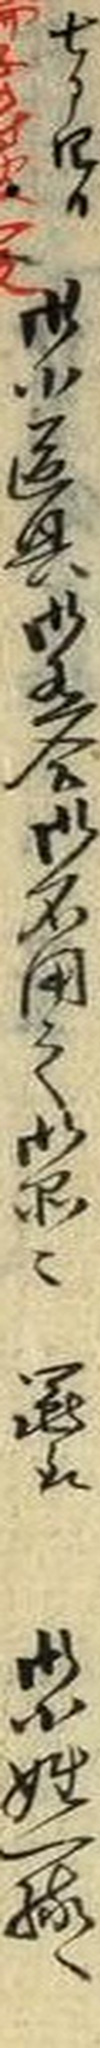御小道具御有合御不用之御品々鬮取御小姓一統へ
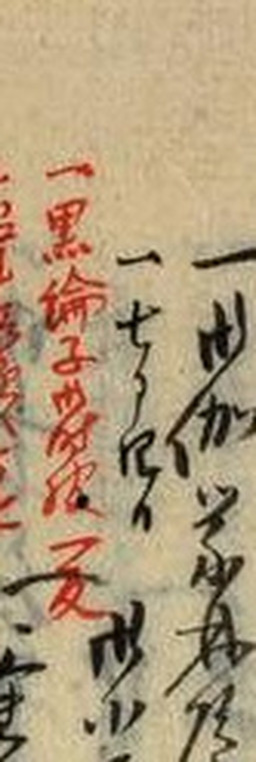一黒綸子御時服一反
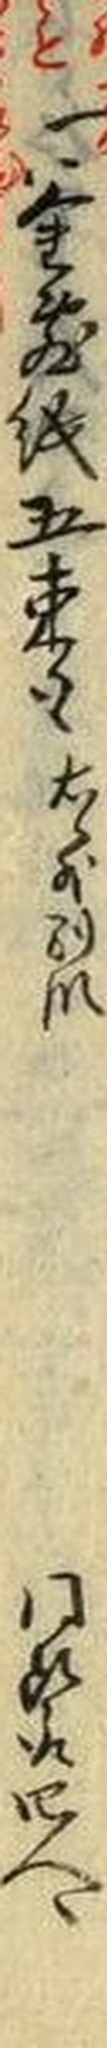釜敷紙五束ツヽ右之外別段同頭取四人へ
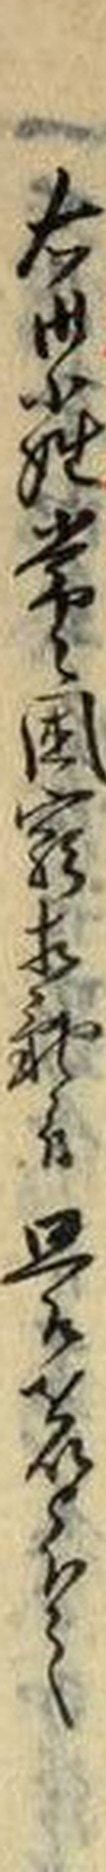右御小姓常々困窮相勤候ニ付思召を以被下之

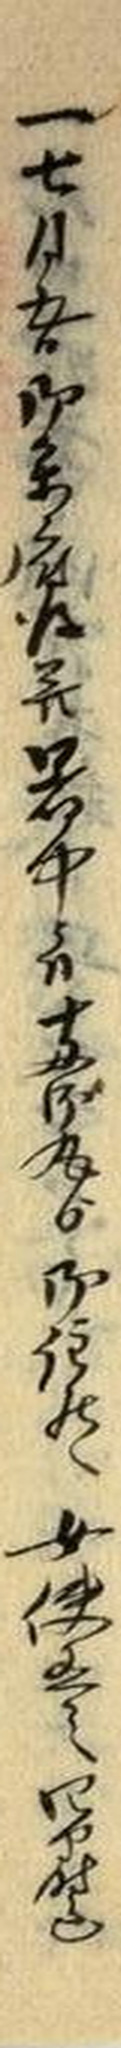一七月五日御参府後并暑中ニ付両御丸ゟ御住居へ女使有之四半時過
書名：少傅日録抄（斉承付側向頭取日記、在府）
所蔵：福井県文書館 Fukui Prefectural Archives
